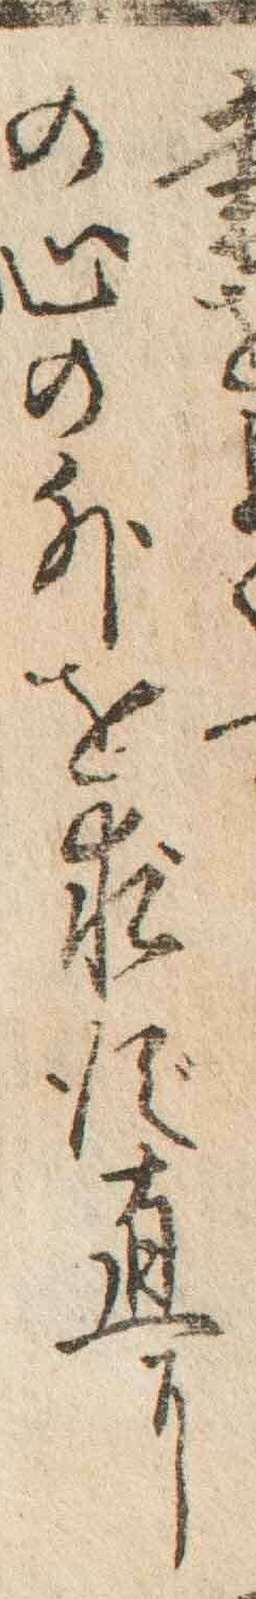の心の外を求ず直に
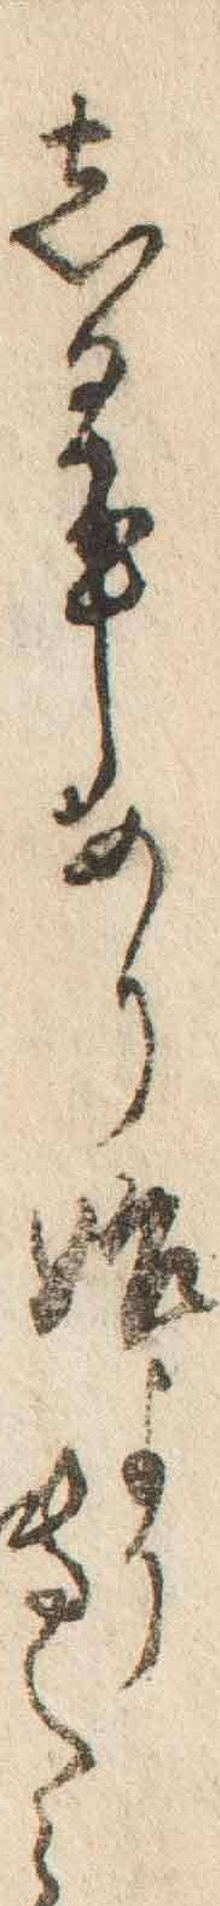しる事あり始より
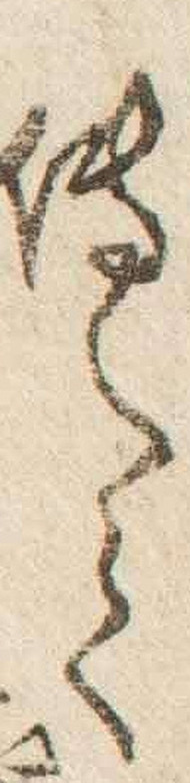伝へて
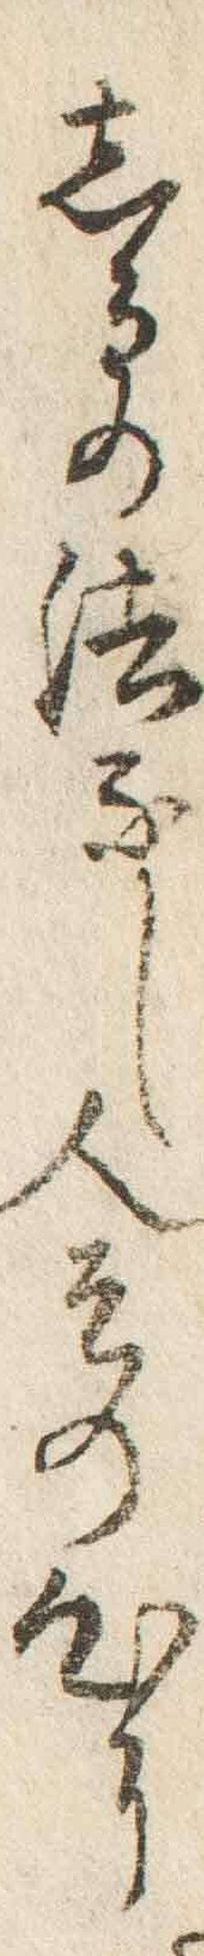しるの法なし人その心に
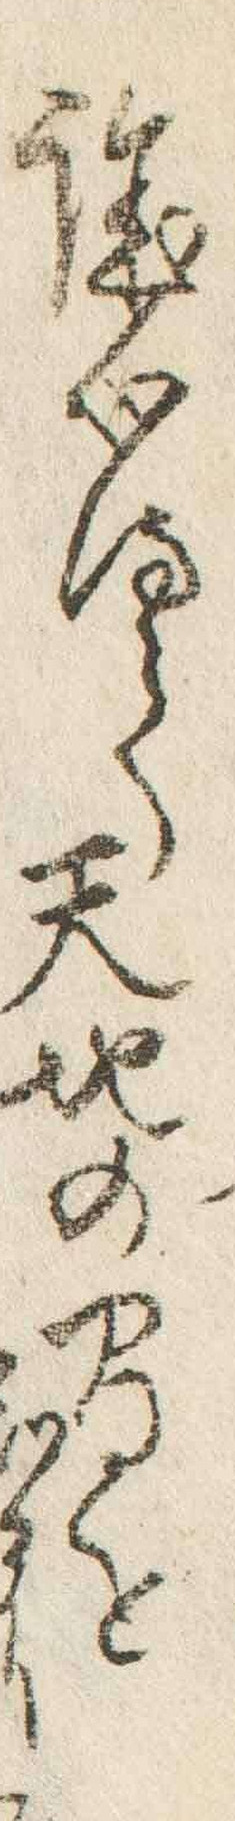誠心得て天地の間を
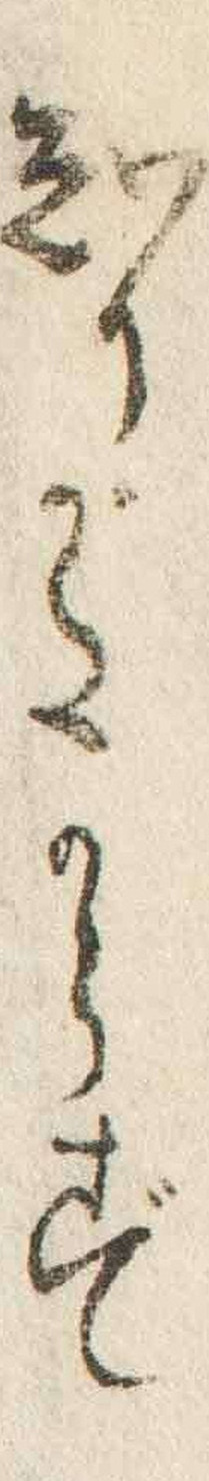知りがたからず
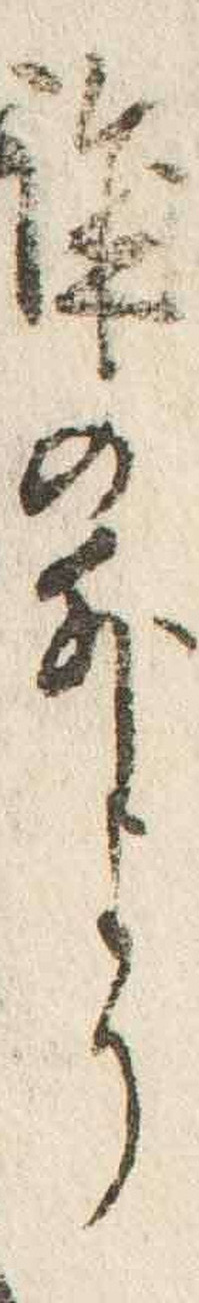誠の外より
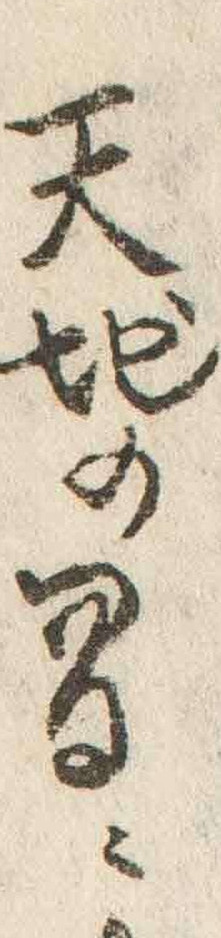天地の間に
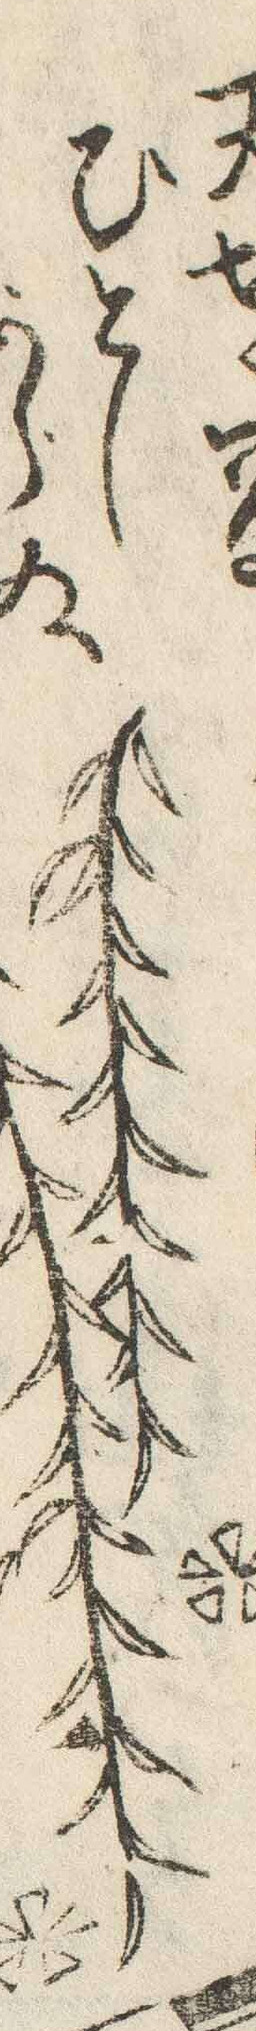ひとし
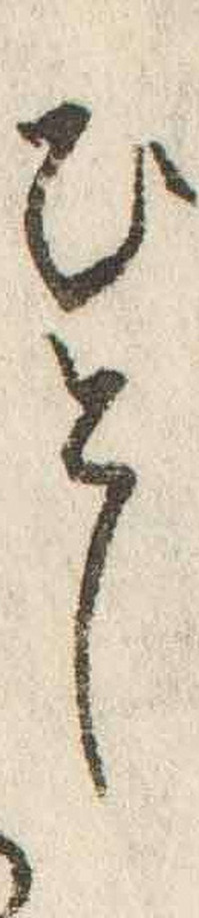ひとし
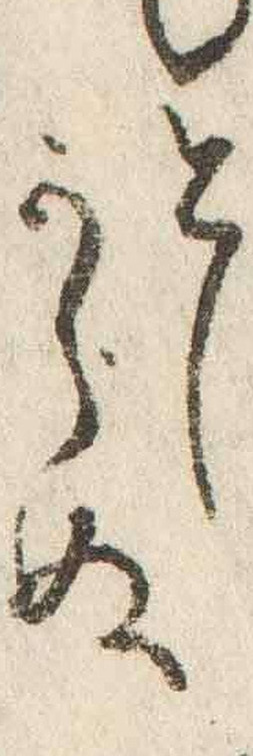からぬ
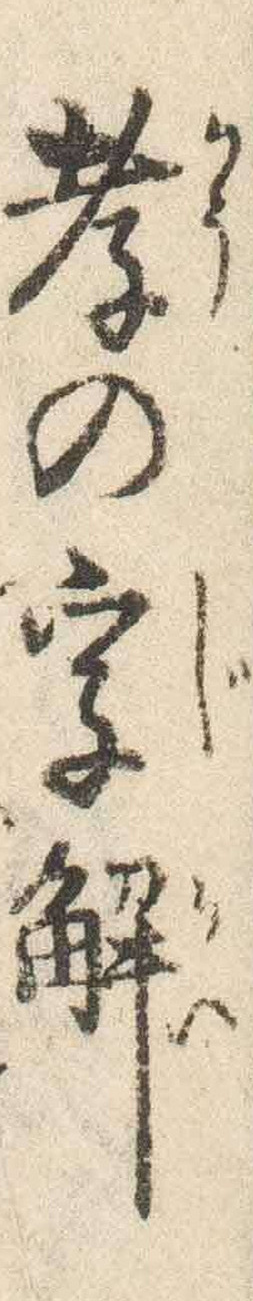孝の字解
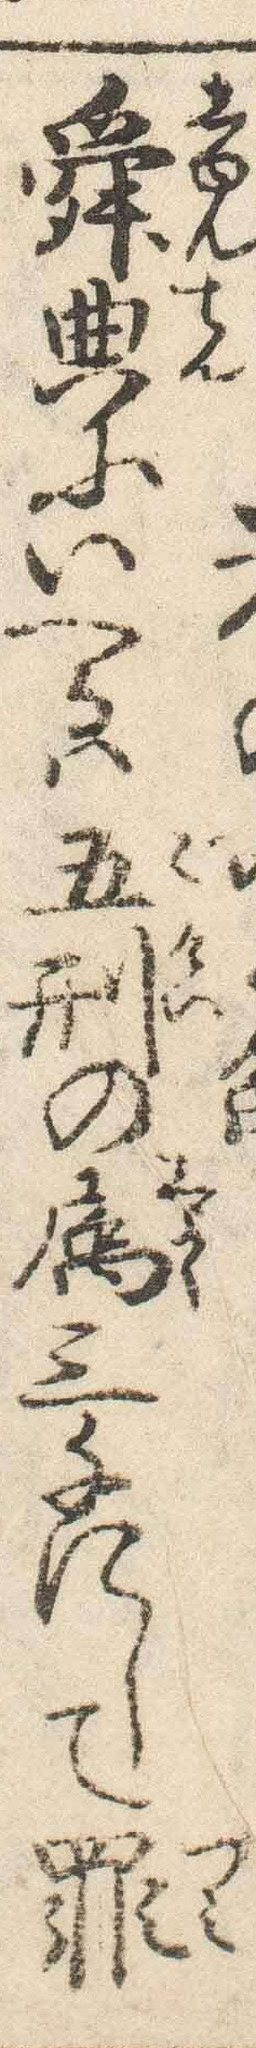舜典にいへるは五刑の属三千にして罪
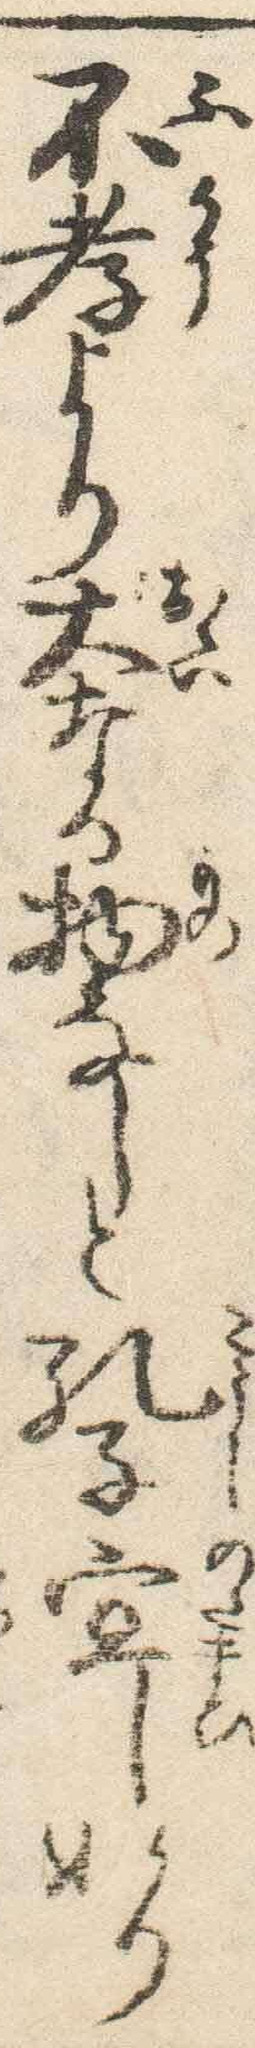不孝より大なる物なしと孔子宣しなり
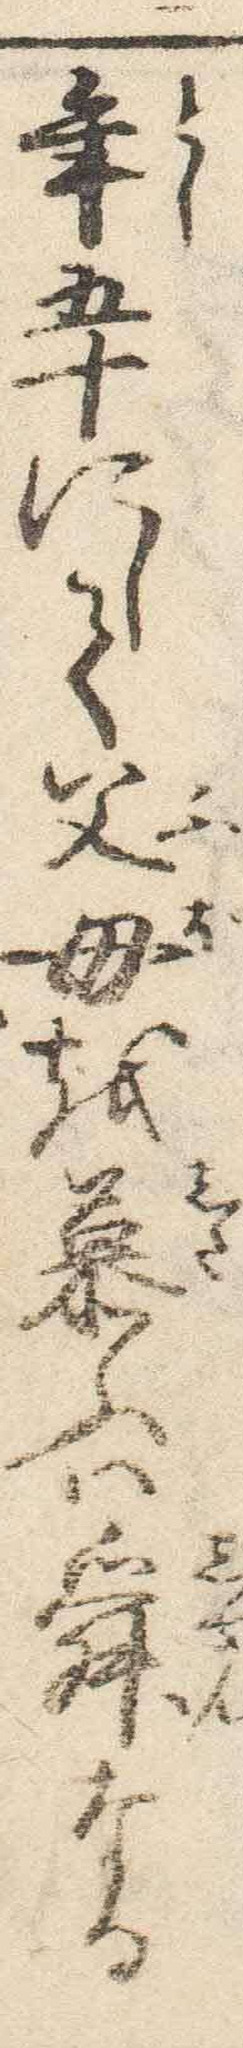年五十にして父母を慕ふは舜なる
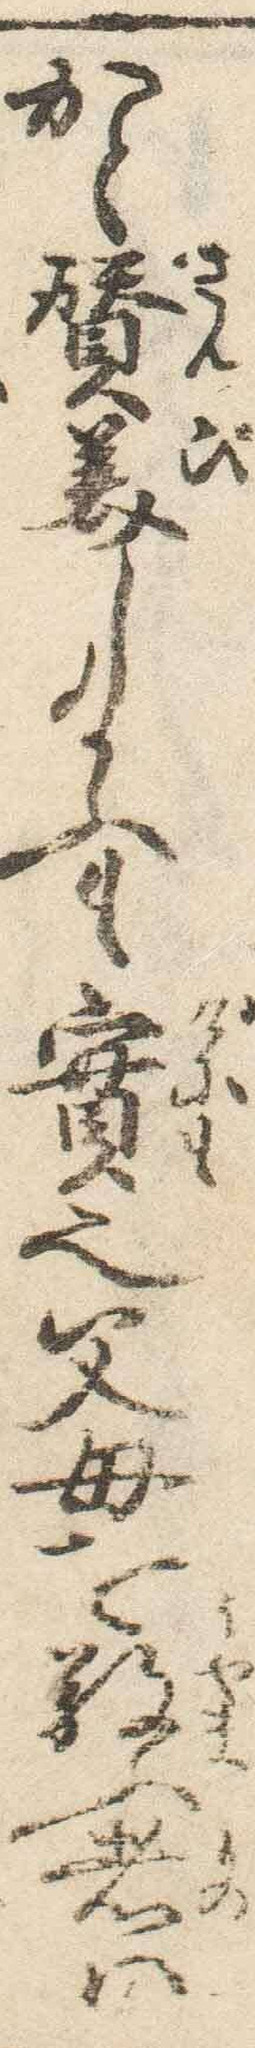かと賛美し給ふも実也父母を敬ふ者は
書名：撫育草
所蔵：東京学芸大学附属図書館 国文学研究資料館
